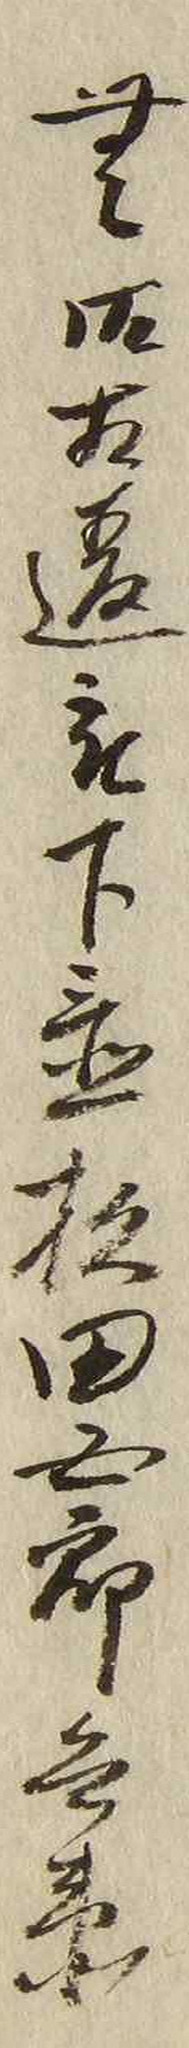無御相違被下置杉田五郎兵衛

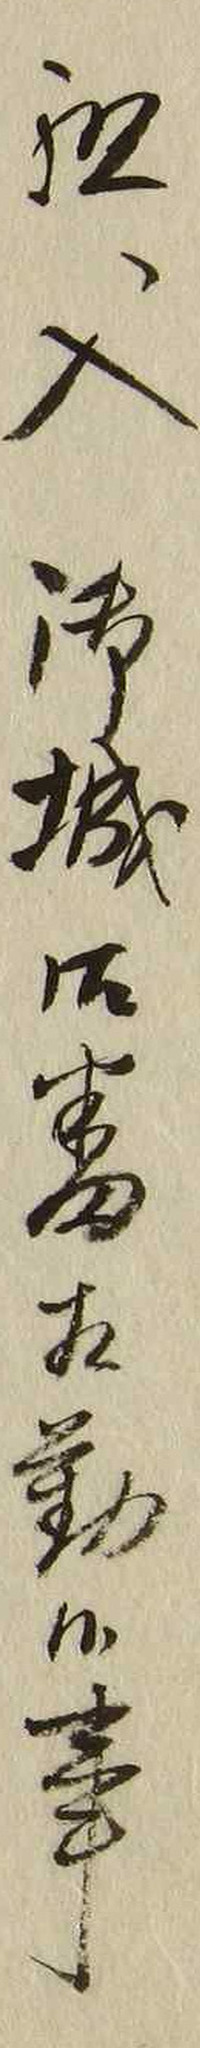組へ入御城御番相勤候事
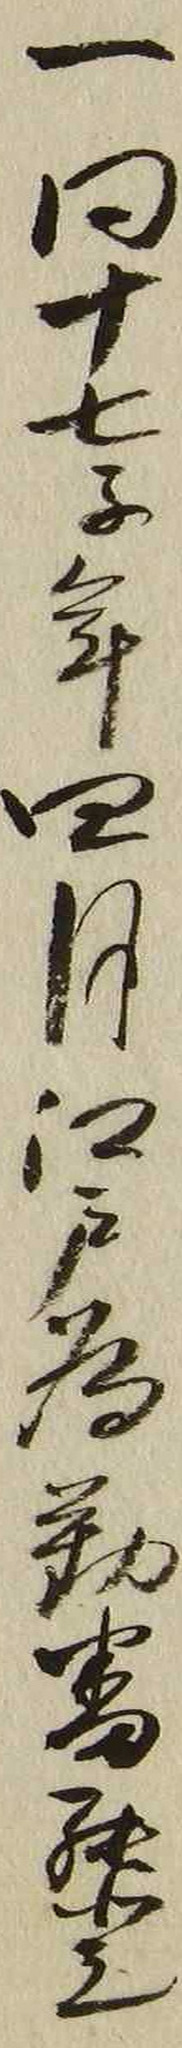一同十七子年四月江戸為勤番罷登
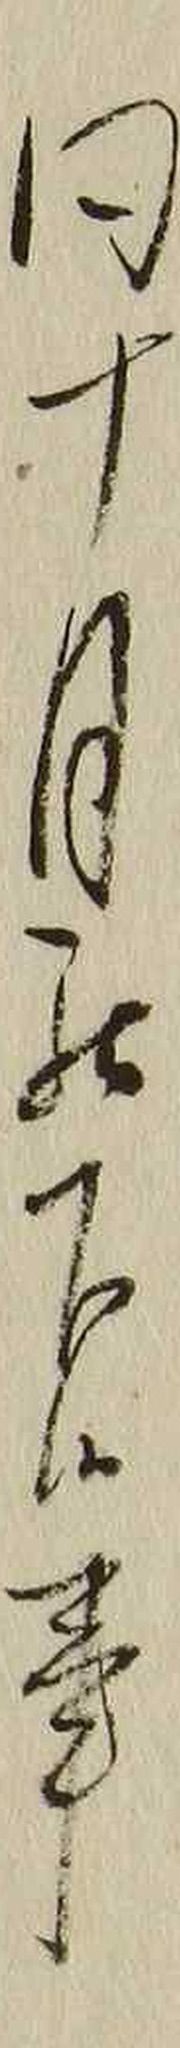同十月罷下候事
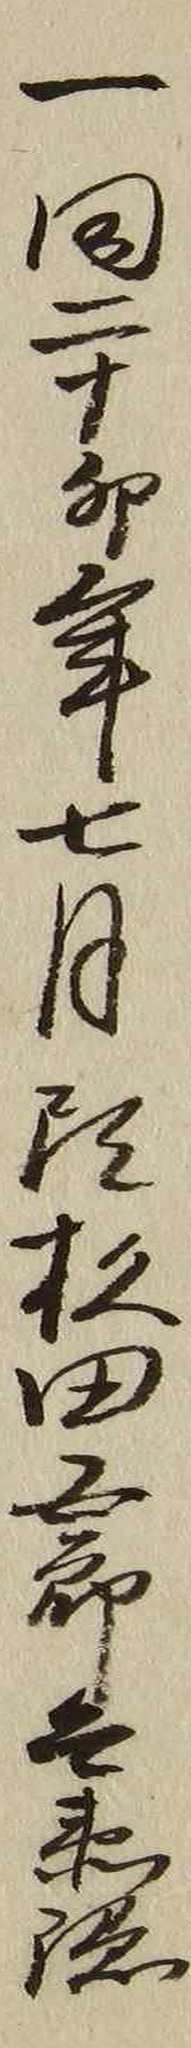一同二十卯年七月頭杉田五郎兵衛隠
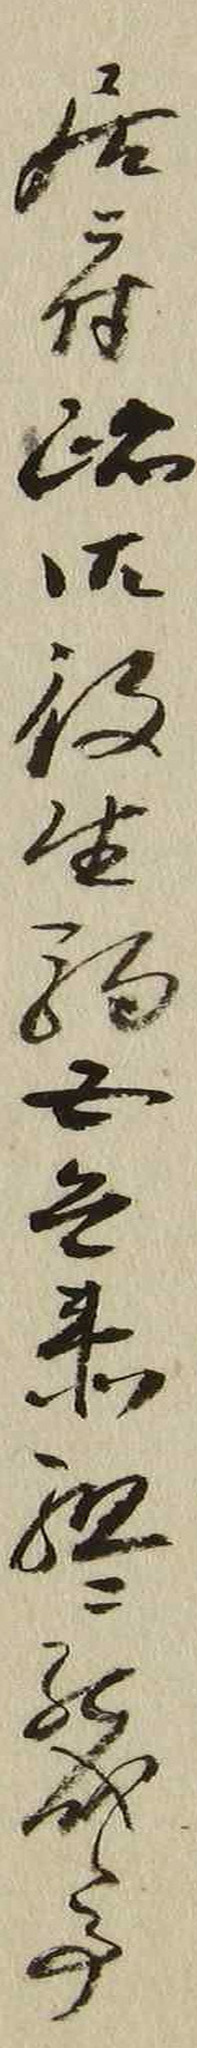居ニ付跡御役生駒五兵衛組ニ罷成候事
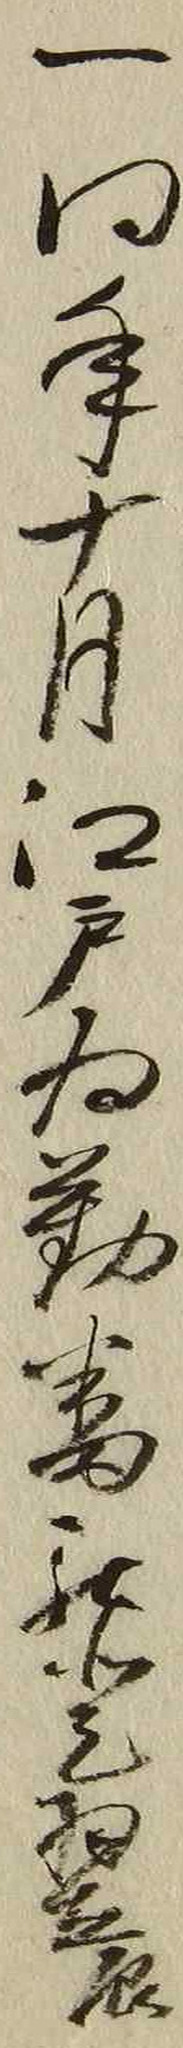一同年十月江戸為勤番罷登翌辰
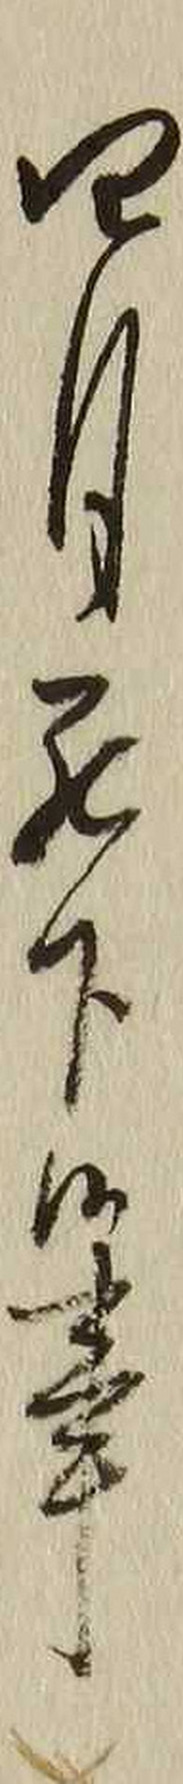四月罷下候事
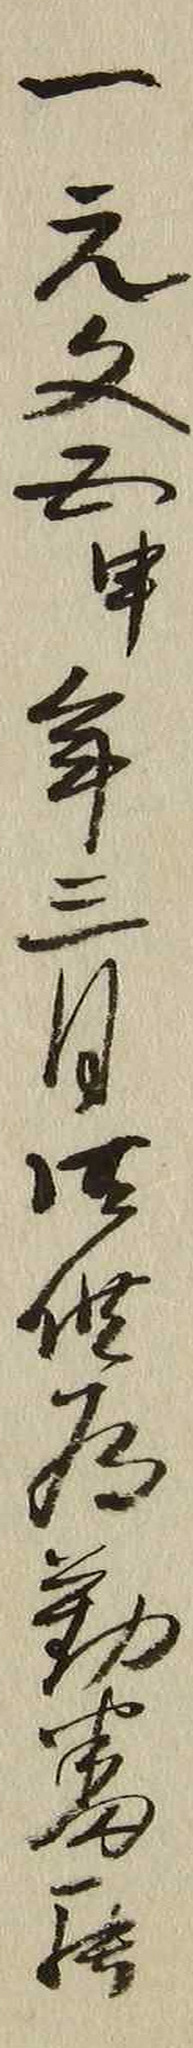一元文五申年三月御供為勤番罷
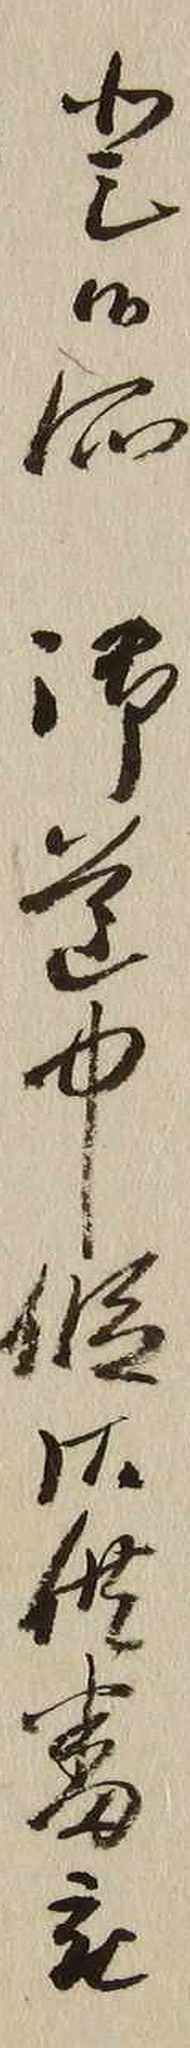登候所御道中仮御供番被
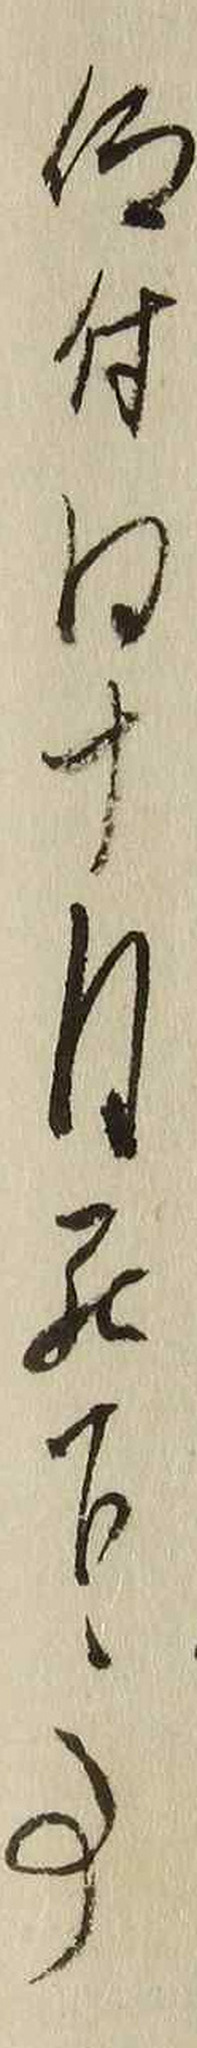仰付同十月罷下候事
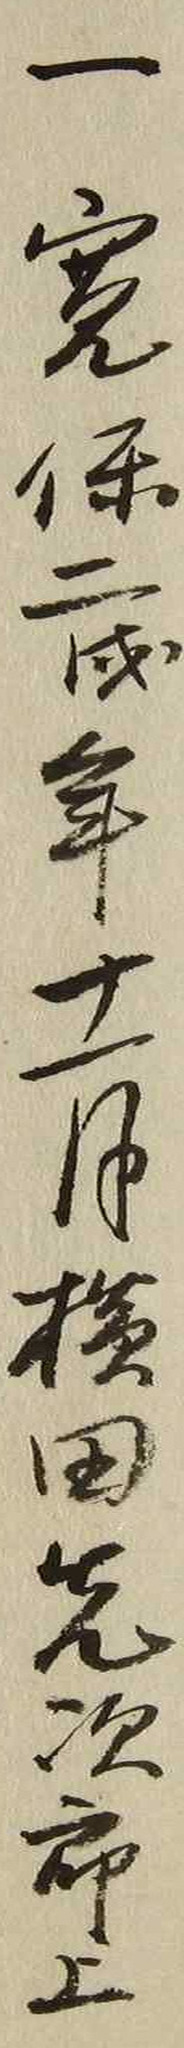一寛保二戌年十一月横田先次郎上
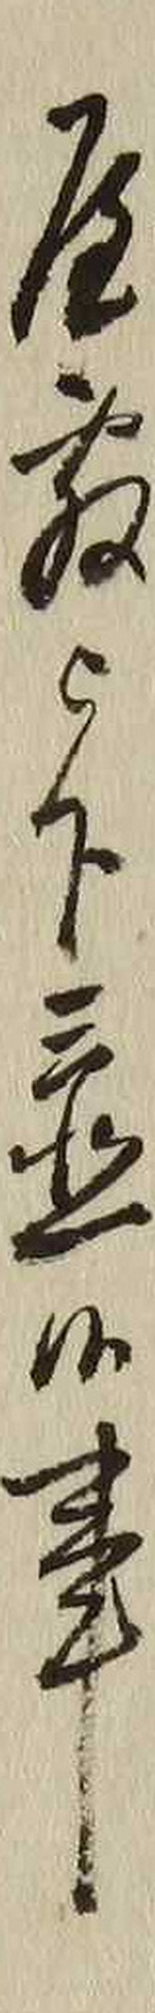屋敷被下置候事
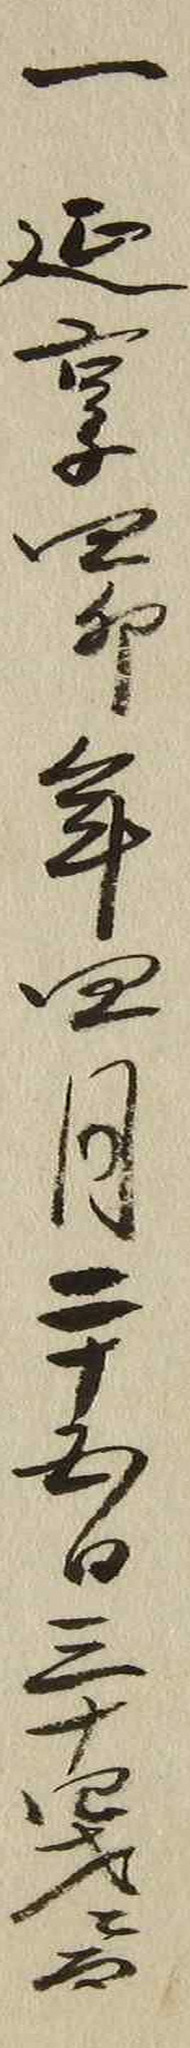一延享四卯年四月二十五日三十四才ニ而
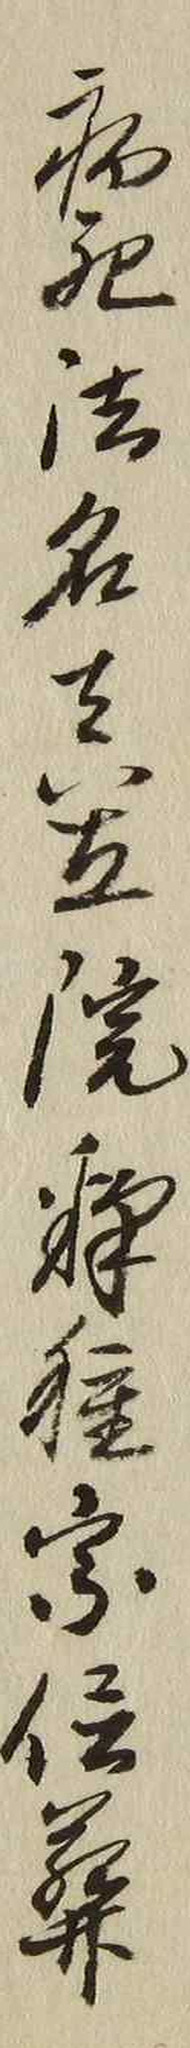病死法名真立院釈種宗信葬
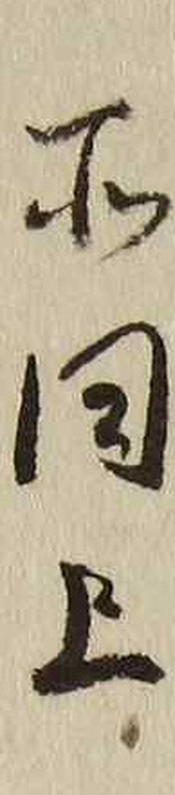所同上
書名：諸士系譜　巻之356　す之部6
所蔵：会津若松市立会津図書館
